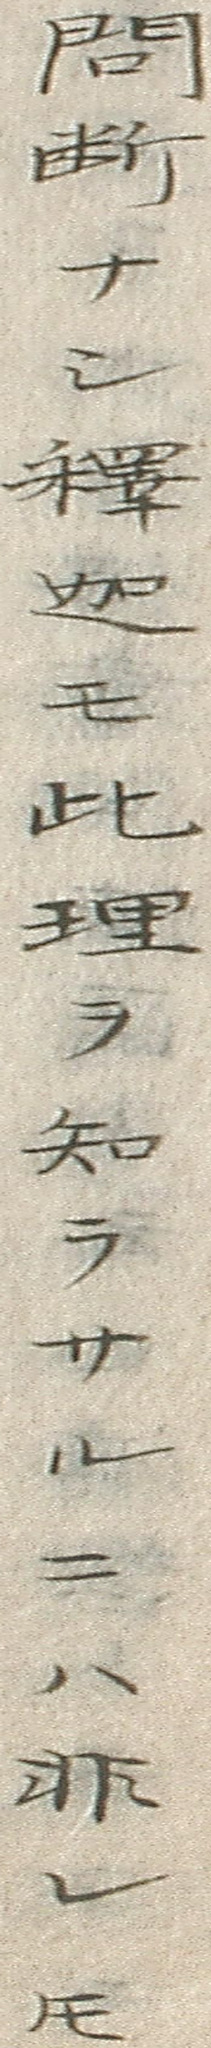問断ナシ釈迦モ此理ヲ知ラサルニハ非レトモ
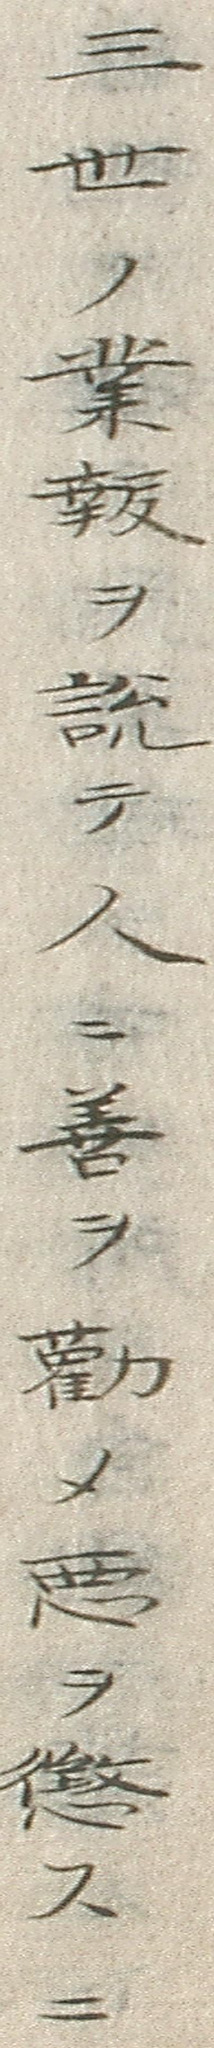三世ノ業報ヲ説テ人ニ善ヲ勤メ悪ヲ懲スニ
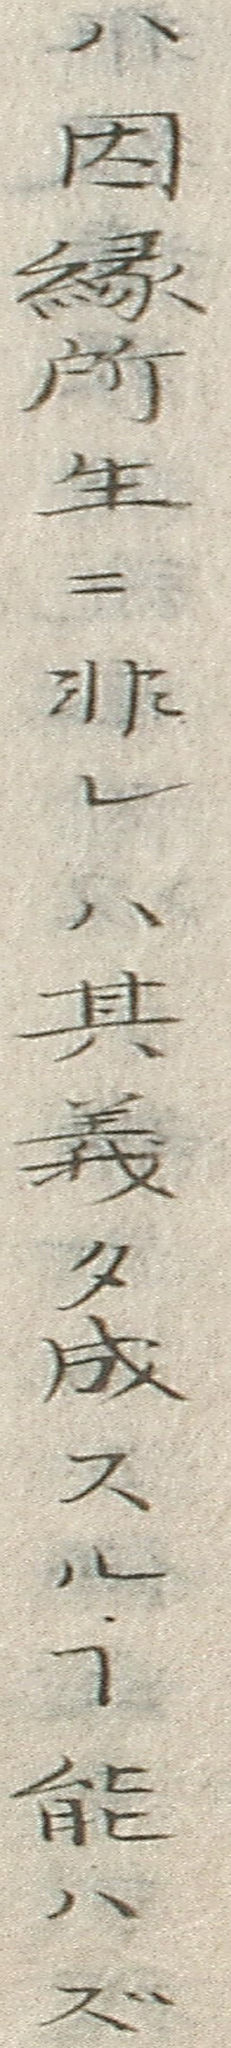ハ因縁所生ニ非レハ其義々成スルコト能ハズ
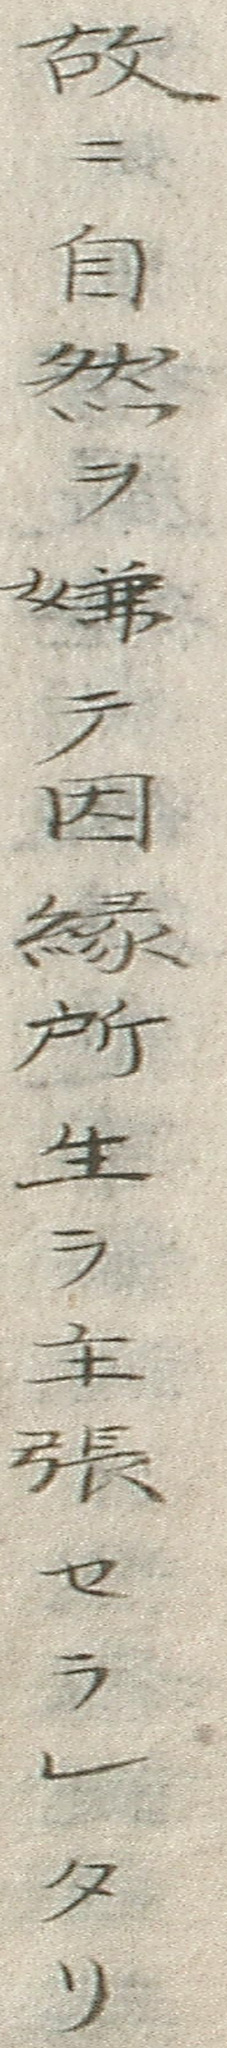故ニ自然ヲ嫌テ因縁所生ヲ主張セラレタリ
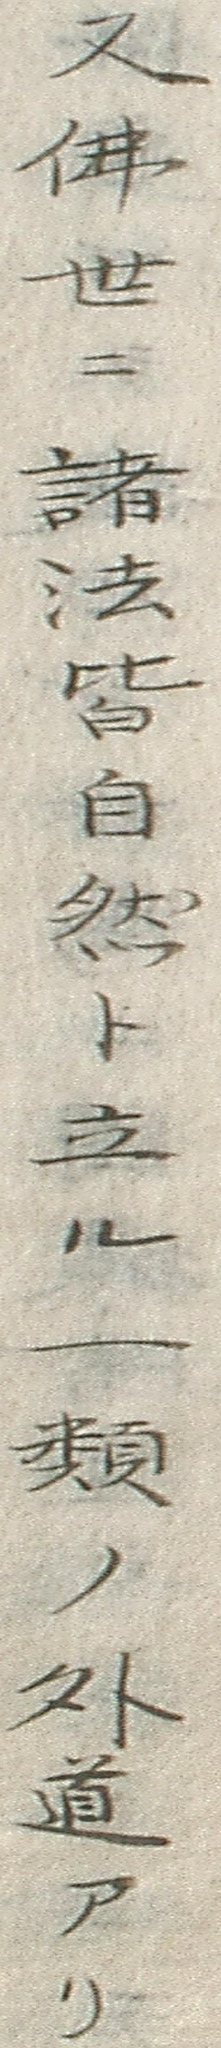又仏世ニ諸法皆自然ト立ル一類ノ外道アリ

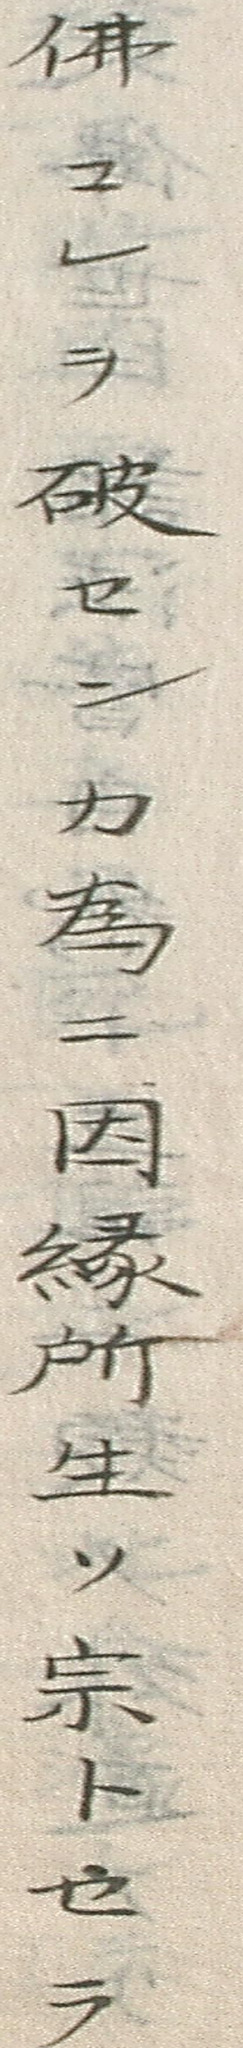仏コレヲ破センカ為ニ因縁所生ソ宗トセラ
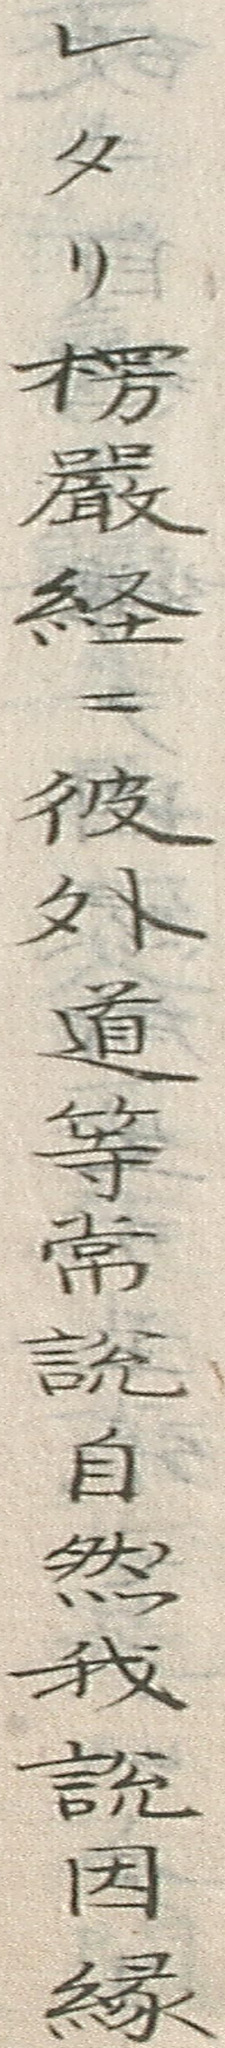レタリ楞巌経ニ彼外道等常説自然我説因縁
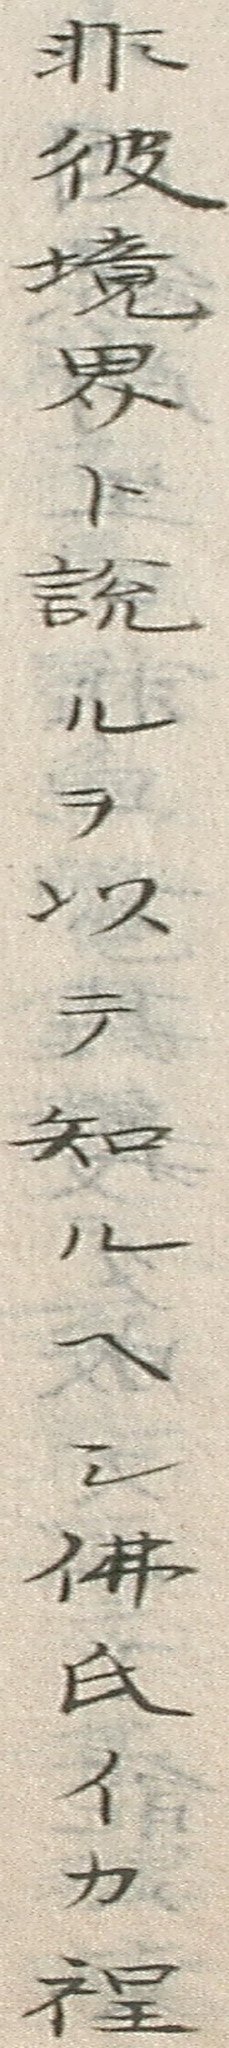非彼境界ト説ルヲ以テ知ルヘシ仏氏イカ程
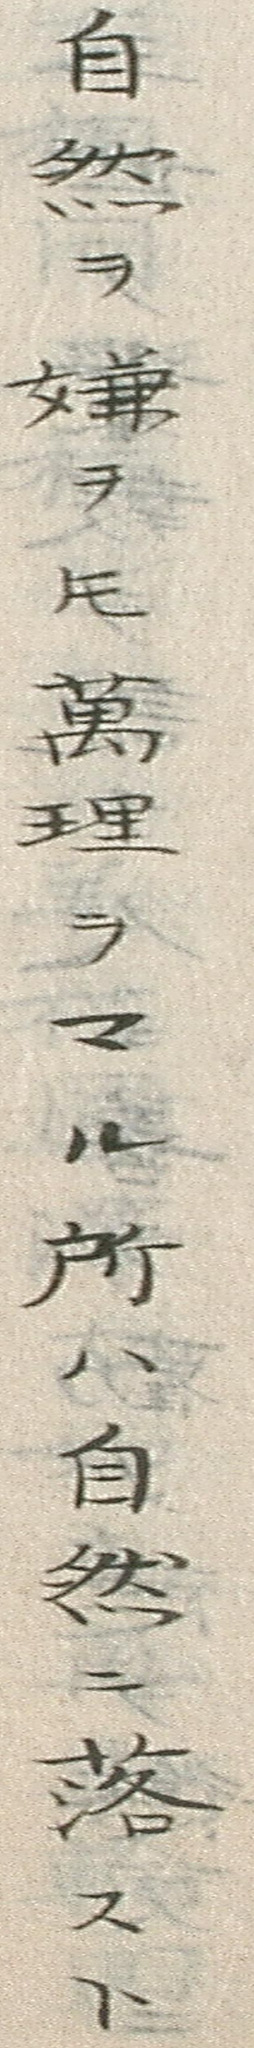自然ヲ嫌ヲトモ万理ヲマル所ハ自然ニ落スト
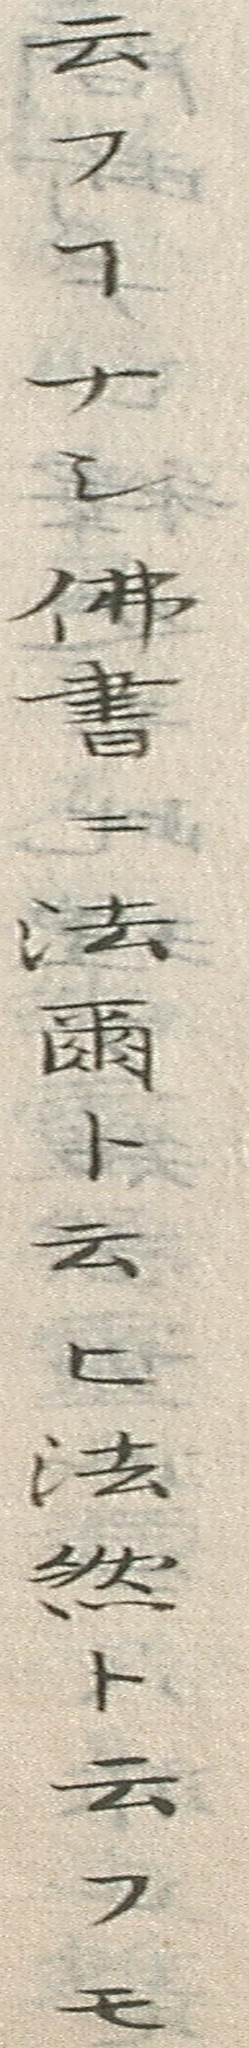云フコトナシ仏書ニ法爾ト云ヒ法然ト云フモ
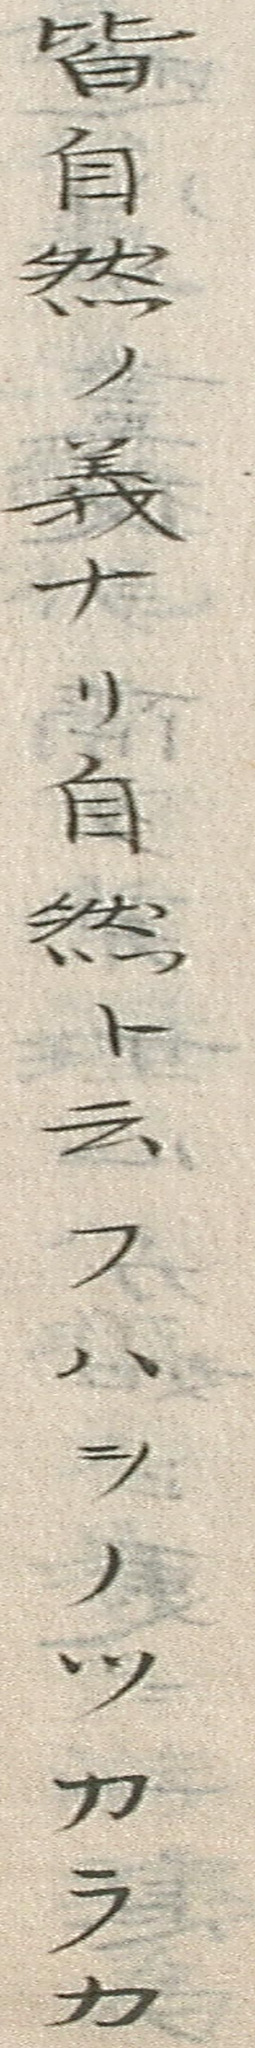皆自然ノ義ナリ自然ト云フハヲノツカラカ
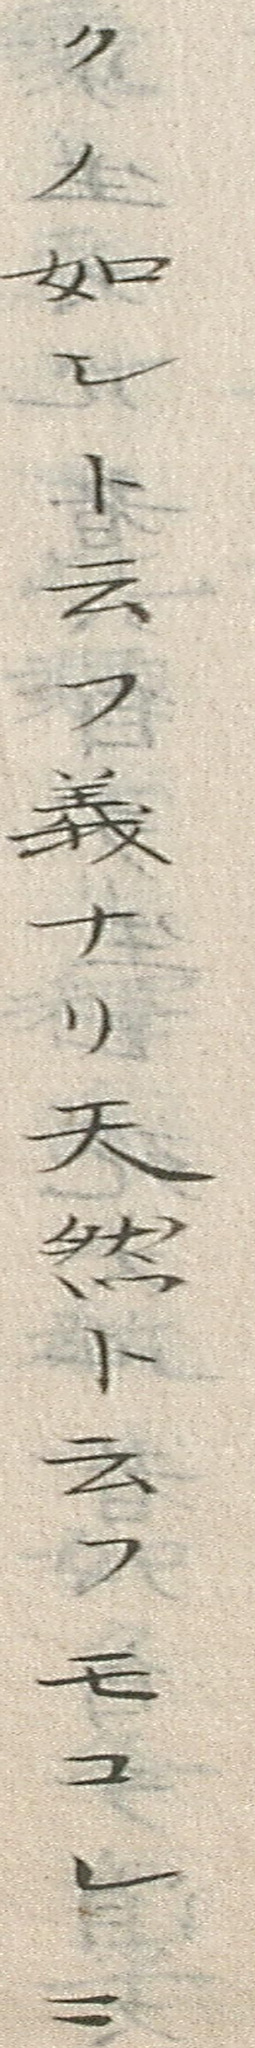クノ如シト云フ義ナリ天然ト云フモコレニ
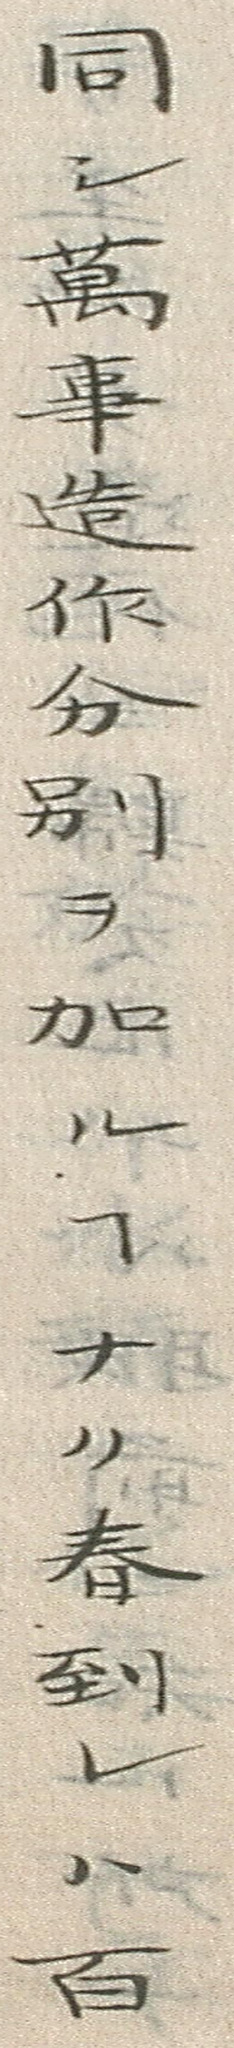同シ万事造作分別ヲ加ルコトナリ春到レハ百
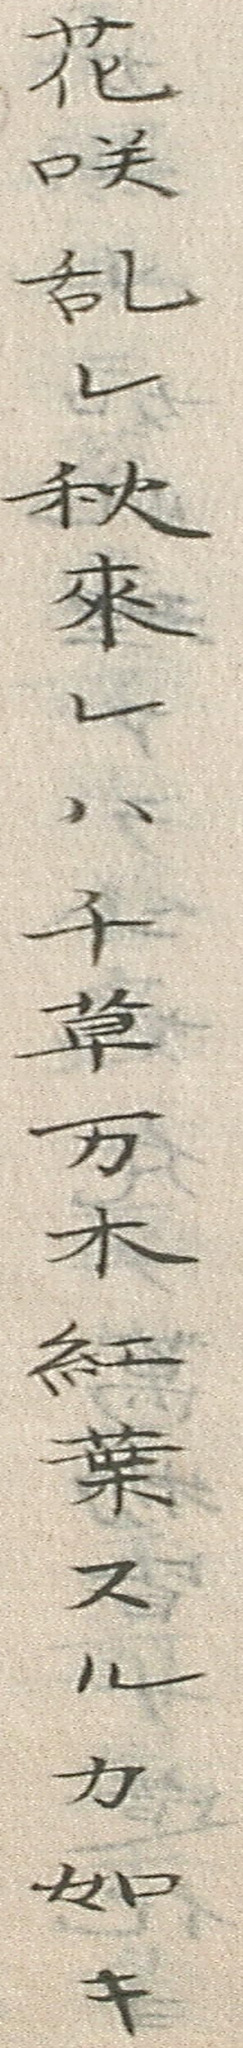花咲乱レ秋来レハ千草万木紅葉スルカ如キ
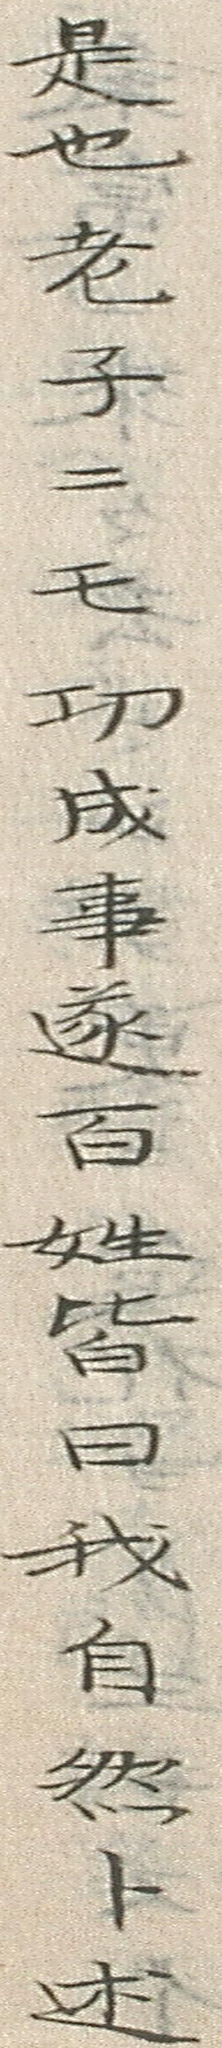是也老子ニモ功成事遂百姓皆曰我自然ト述
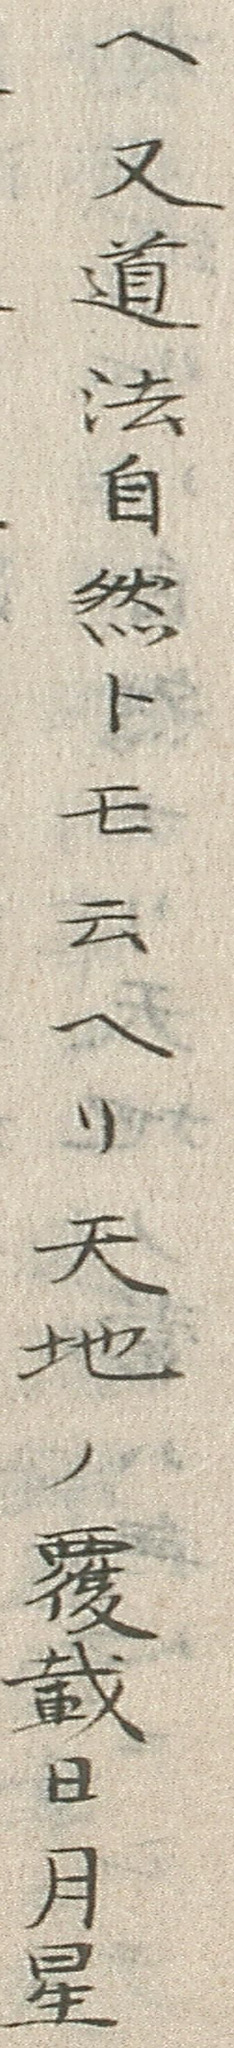ヘ又道法自然トモ云ヘリ天地ノ覆載日月星
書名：天學略名目羽翼　全
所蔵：東京大学地震研究所図書室 Earthquake Research Institute Library, The University of Tokyo, JAPAN
